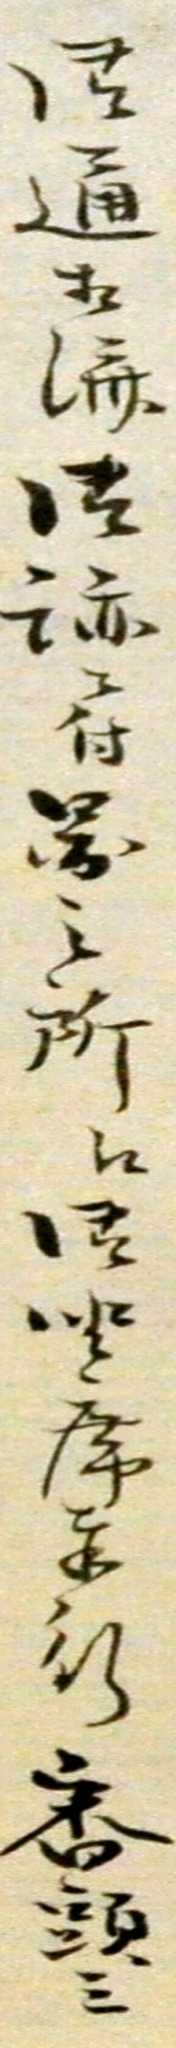御通相済御跡ニ付圖之所え御坐席奉行番頭三
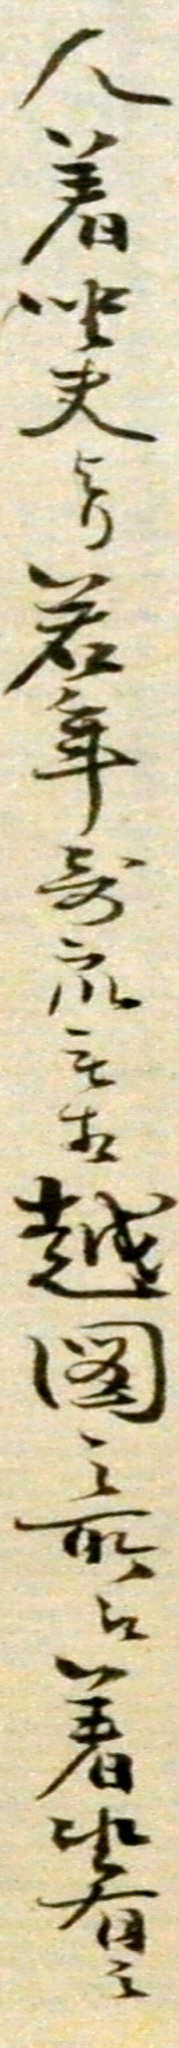人着坐夫より若年寄衆被相越圖之所え着坐有之
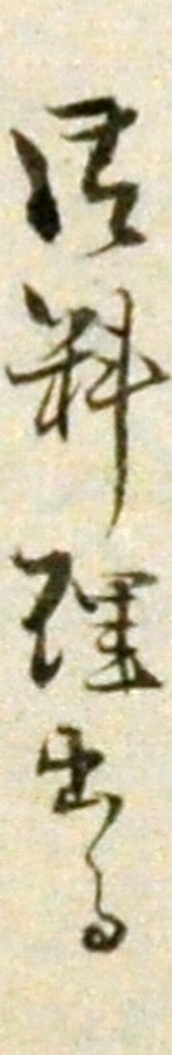御料理出る
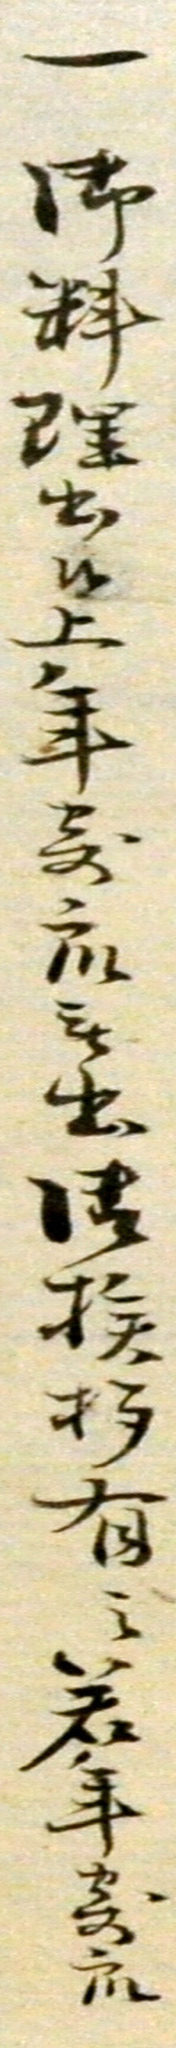一御料理出候上年寄衆被出御挨拶有之若年寄衆
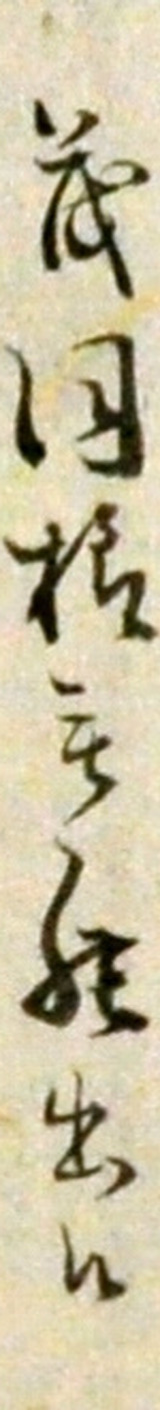も同様被罷出候
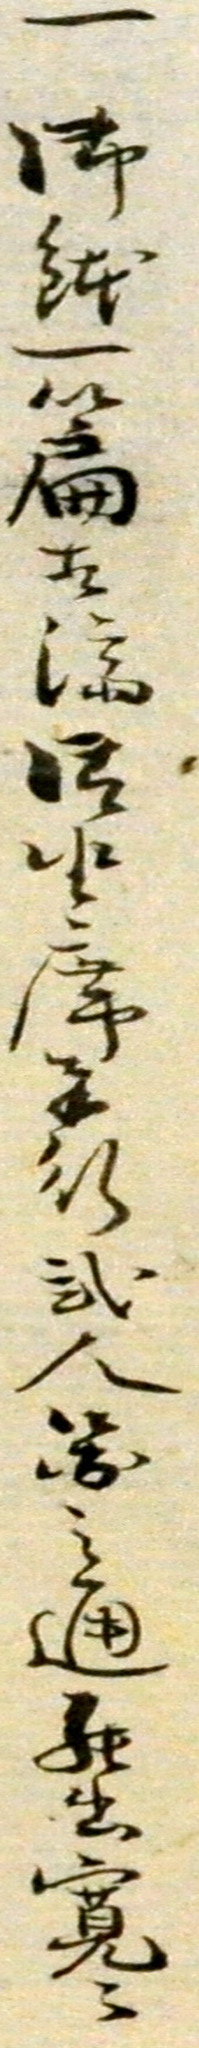一御鉢一篇相済御坐席奉行弐人圖之通罷出寛々
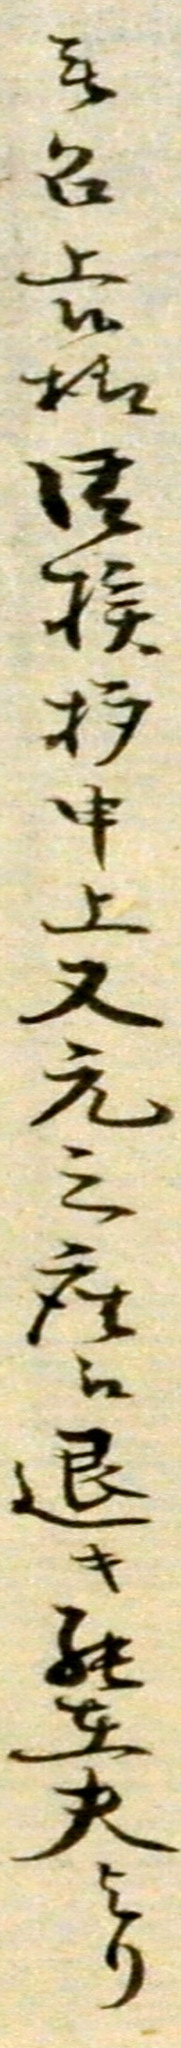被召上候様御挨拶申上又元之座え退キ罷在夫より
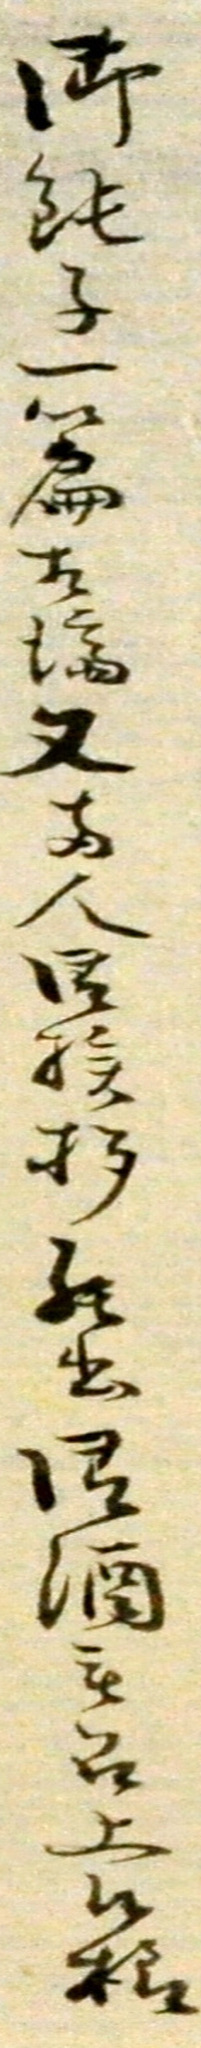御銚子一篇相済又両人御挨拶罷出御酒被召上候様
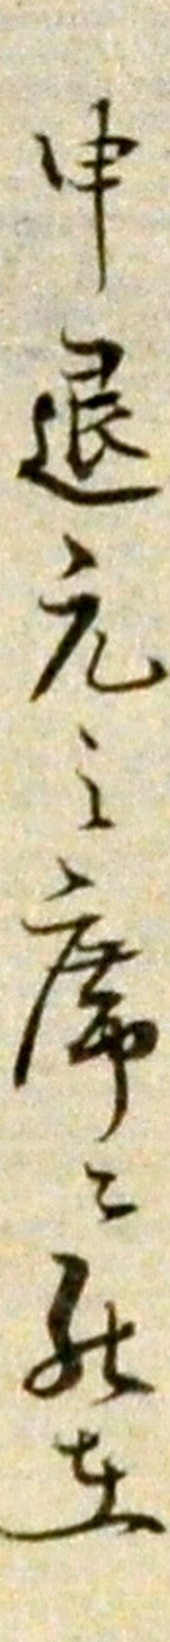申退元之席ニ罷在
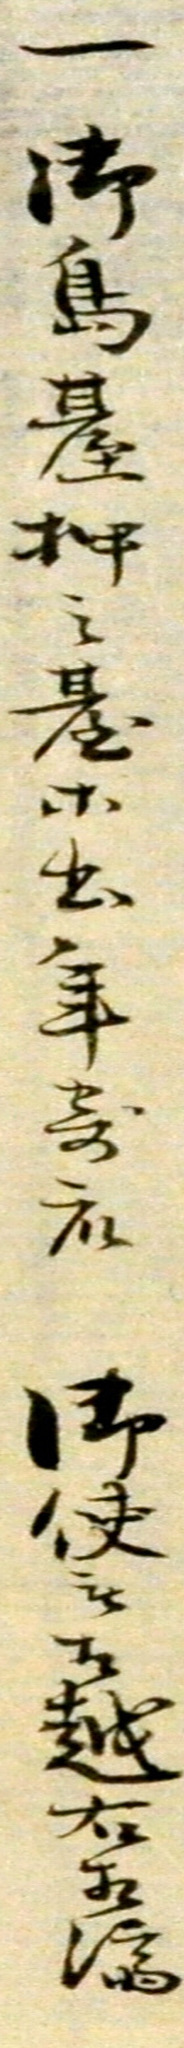一御島臺押之臺等出年寄衆御使被相越右相済
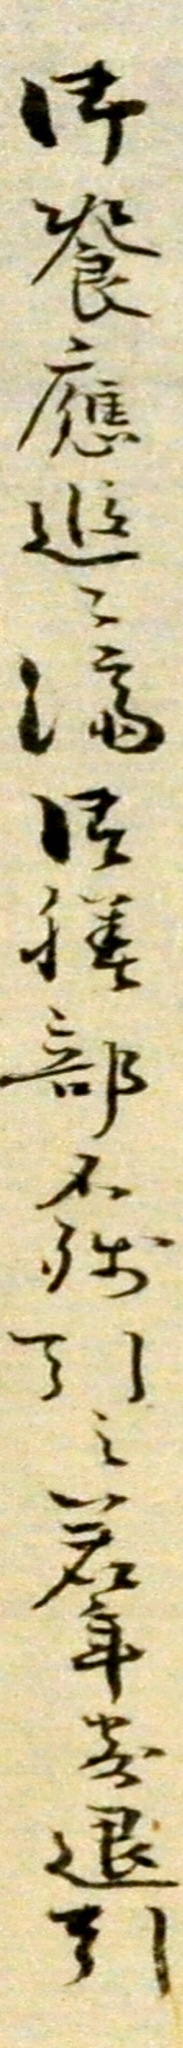御饗應追々済御膳部腑不残引之若年寄退引
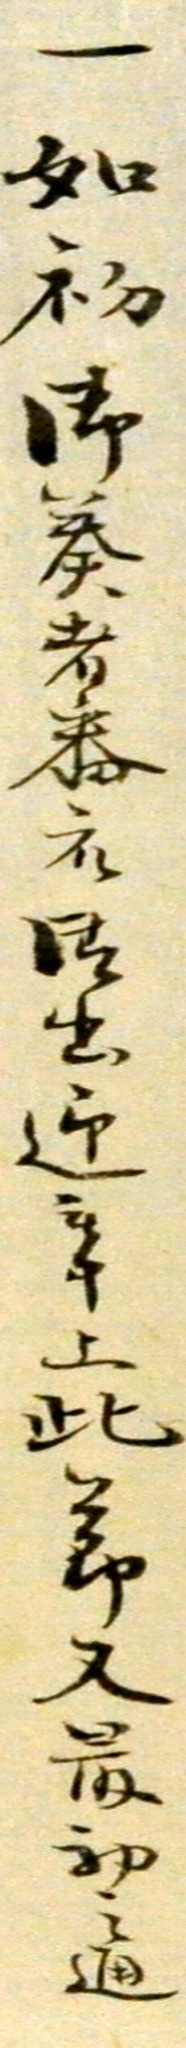一如初御奏者番衆御出迎被申上此節又最初之通
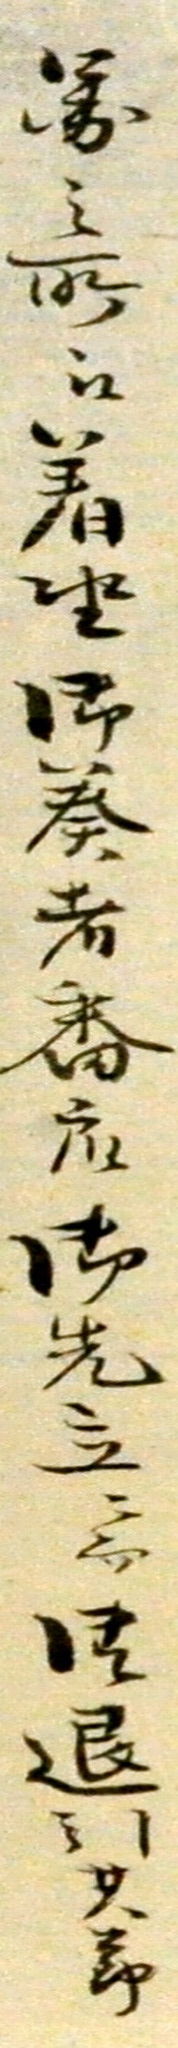圖之所え着坐御奏者番衆御先立ニ而御退引其節
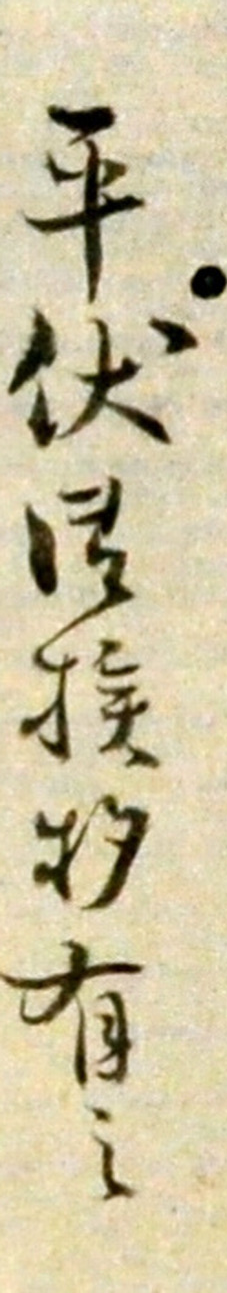平伏御挨拶有之
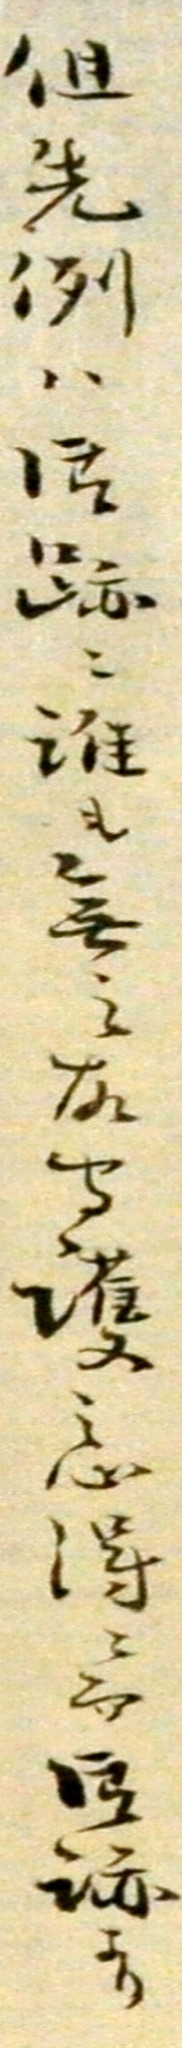但先例ハ御跡ニ誰も無之故守護之心得ニ而御跡より
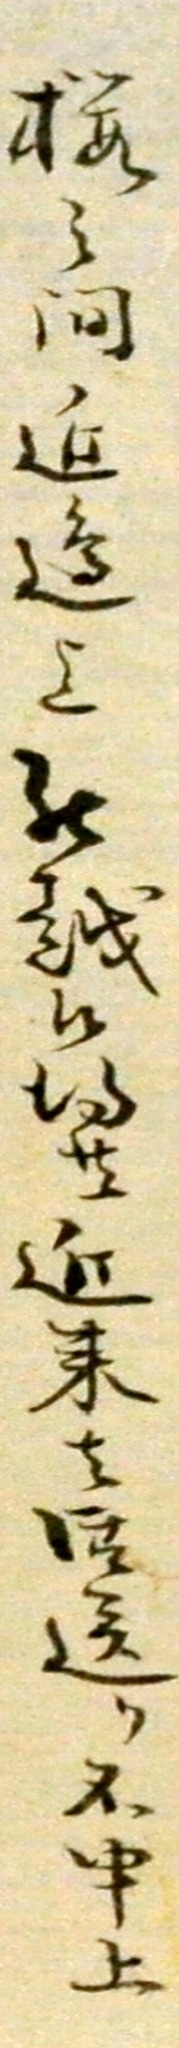桜之間近辺迄罷越候得共近来は御送り不申上
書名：竹ノ間御座席奉行勤方控外
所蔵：伊那市立高遠町図書館・合同会社AMANE
